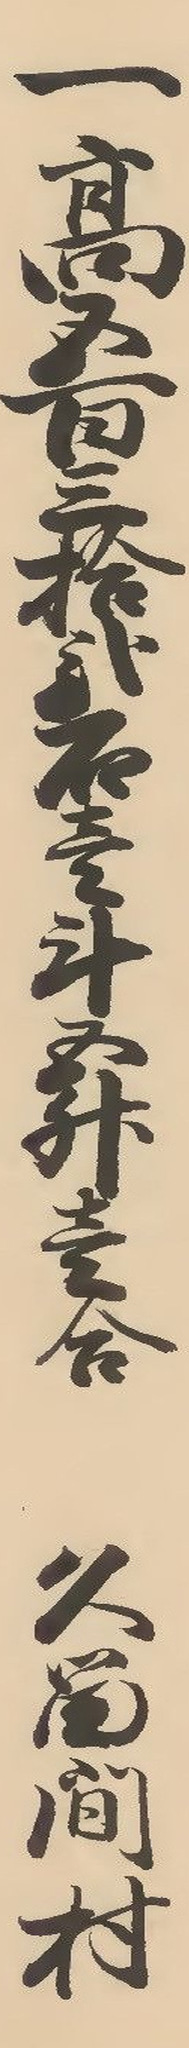一髙五百三拾弐石壱斗五升壱合久留間村
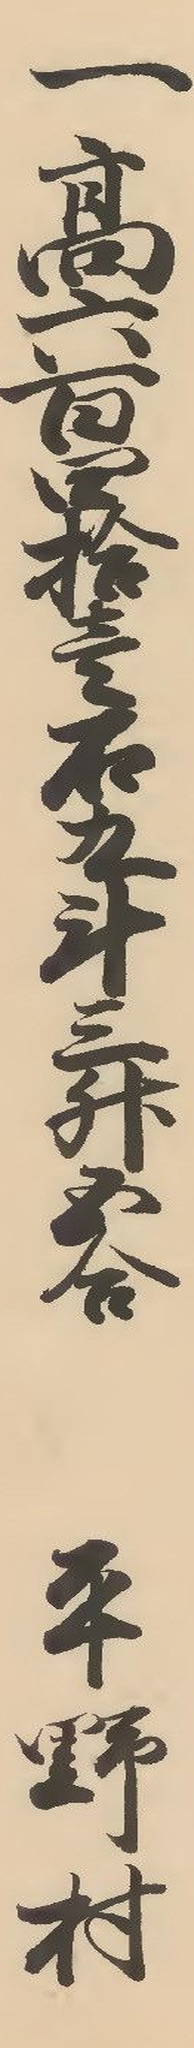一髙六百四拾壱石九斗三升五合平野村

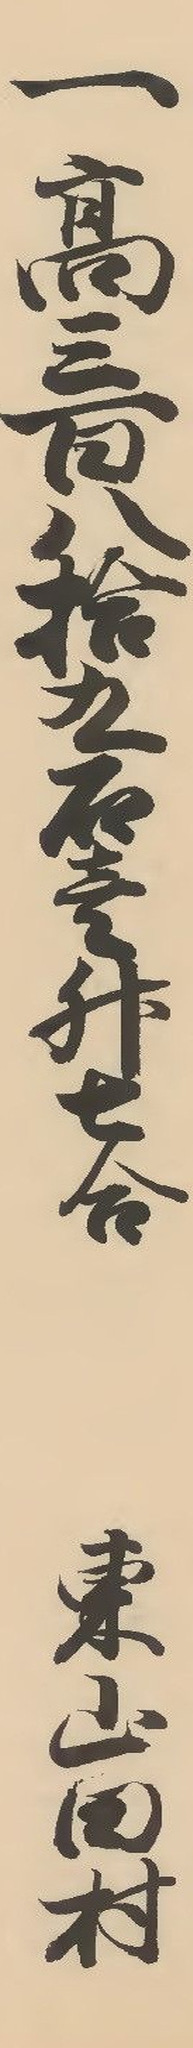一髙三百八拾九石壱升七合東山田村
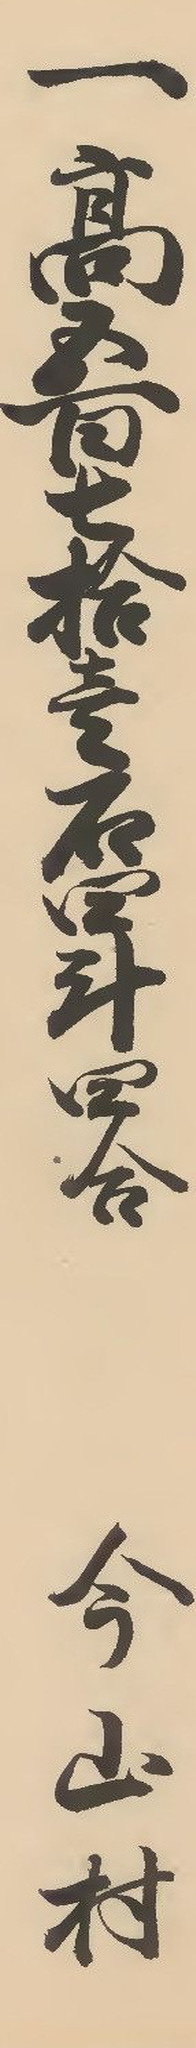一髙五百七拾壱石四斗四合今山村
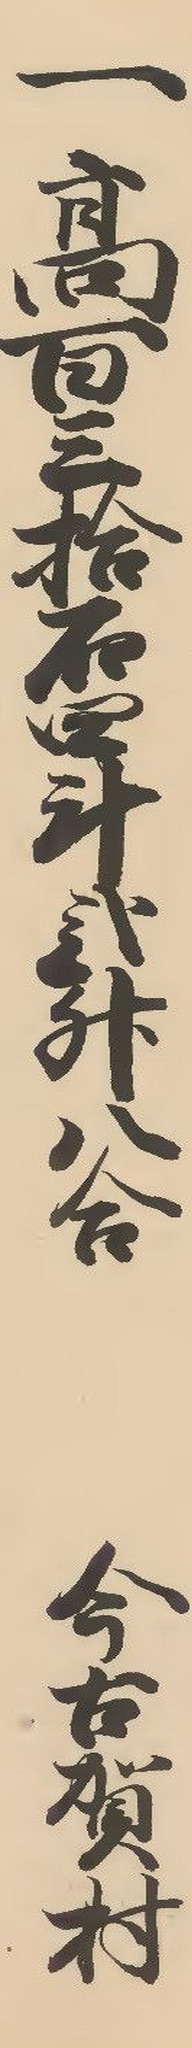一髙百三拾石四斗弐升八合今古賀村
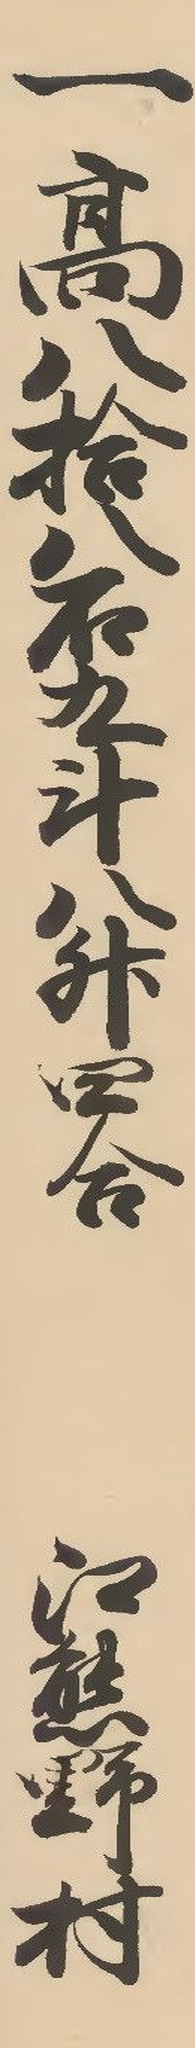一髙八拾八石九斗八升四合江熊野村
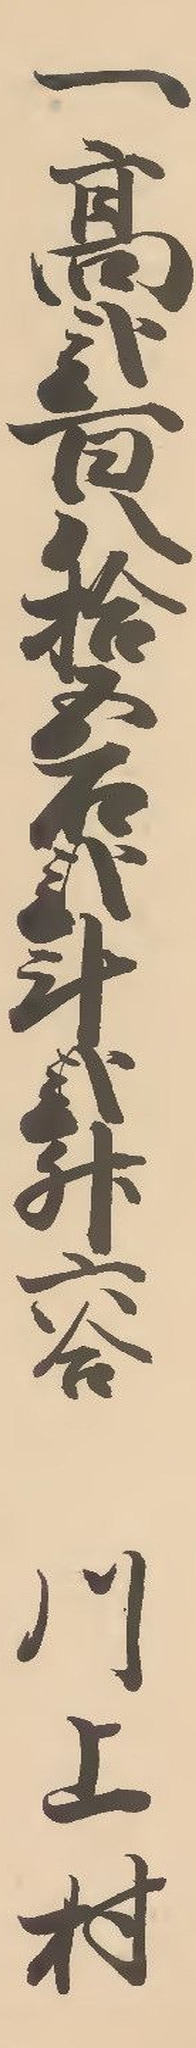一髙弐百八拾五石弐斗弐升六合川上村
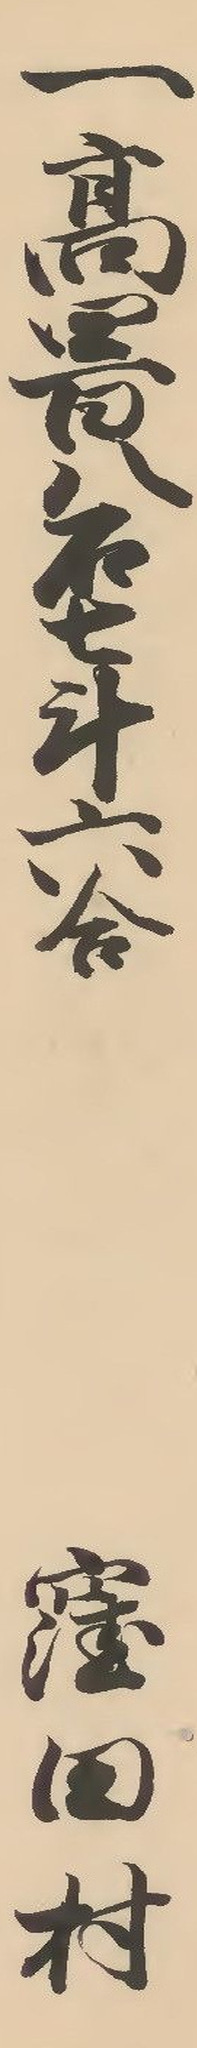一髙四百八石七斗六合窪田村
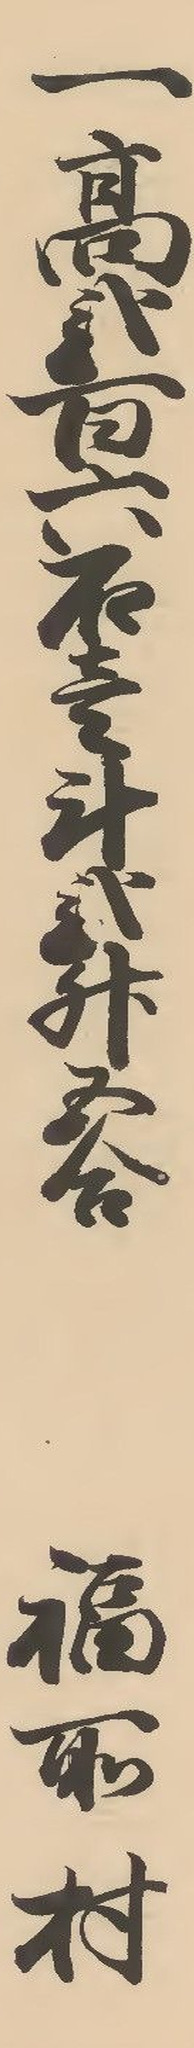一髙弐百六石壱斗弐升五合福所村
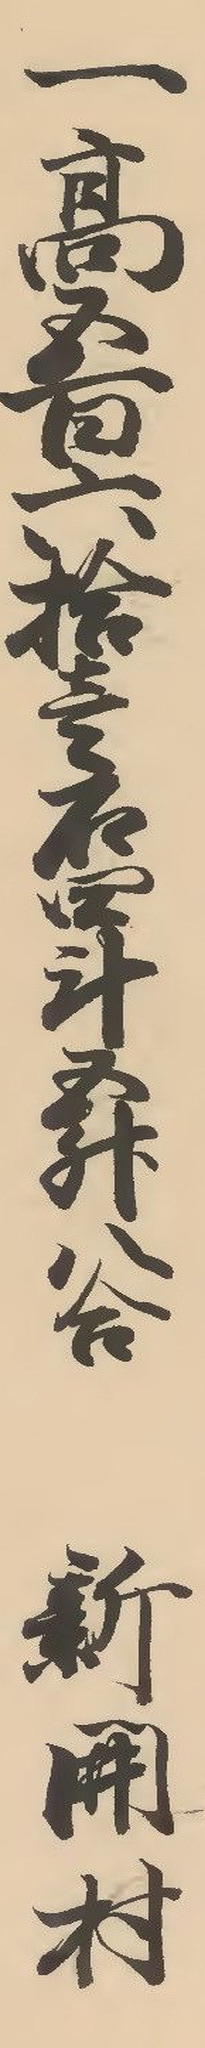一髙五百六拾壱石四斗五升八合新開村

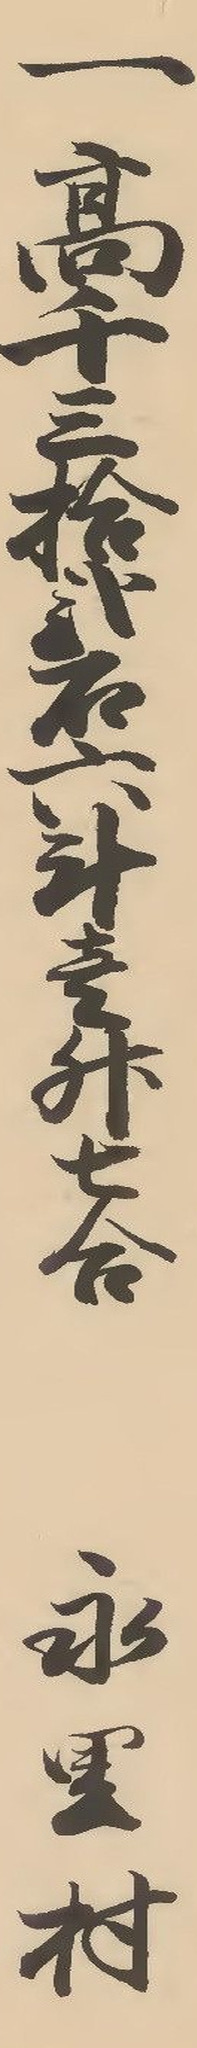一髙千三拾弐石六斗壱升七合永里村
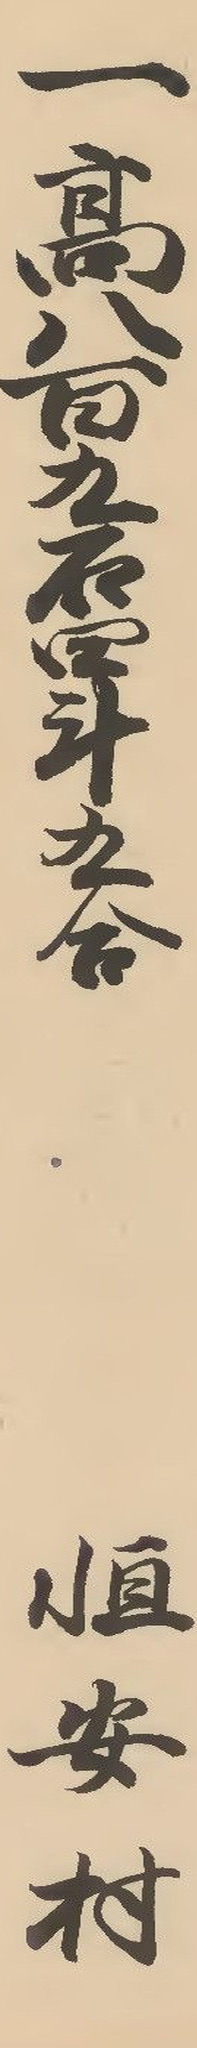一髙八百九石四斗九合恒安村
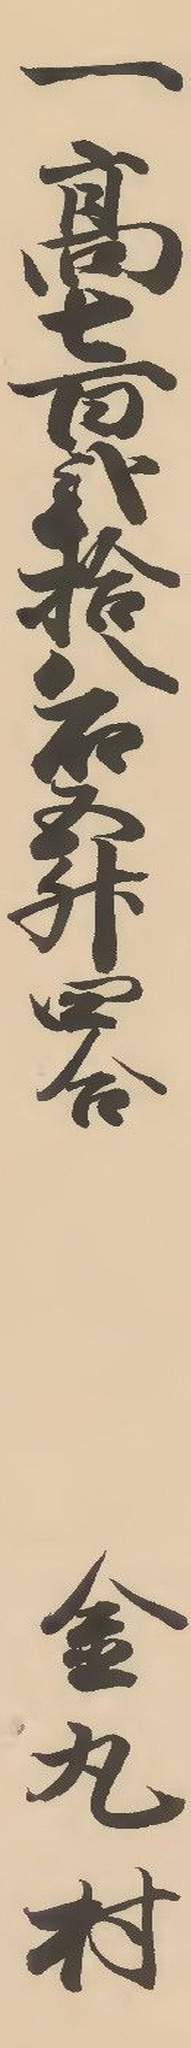一髙七百弐拾八石五升四合金丸村
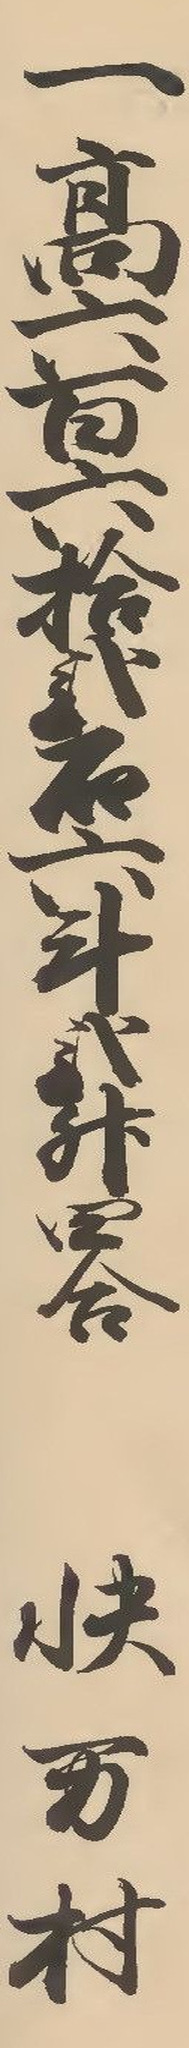一髙六百六拾弐石六斗弐升四合快万村
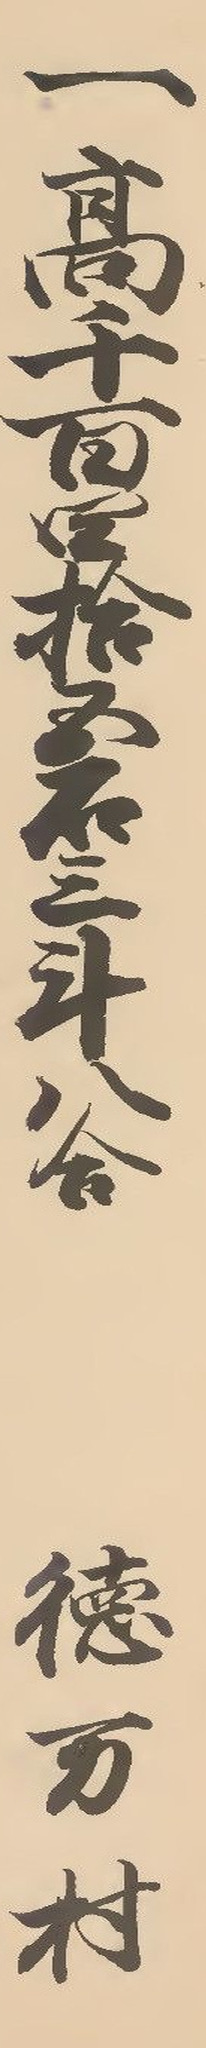一髙千百四拾五石三斗八合徳万村
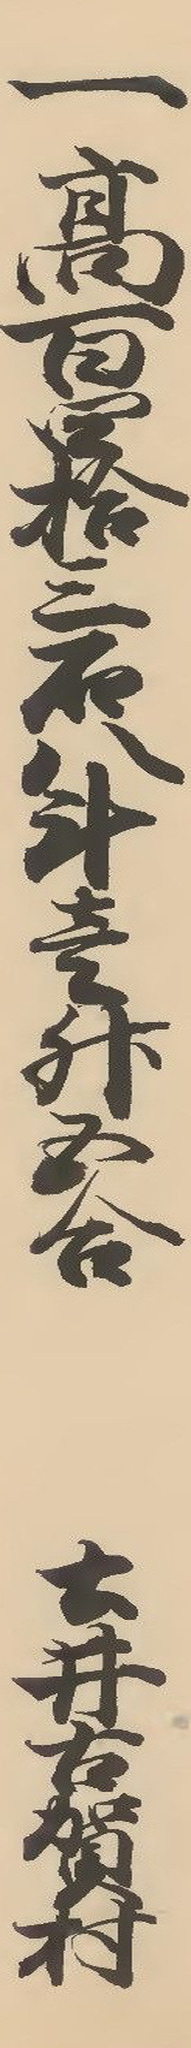一髙百四拾三石八斗壱升五合土井古賀村
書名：肥前国郷帳
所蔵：国立公文書館 National Archives of Japan
